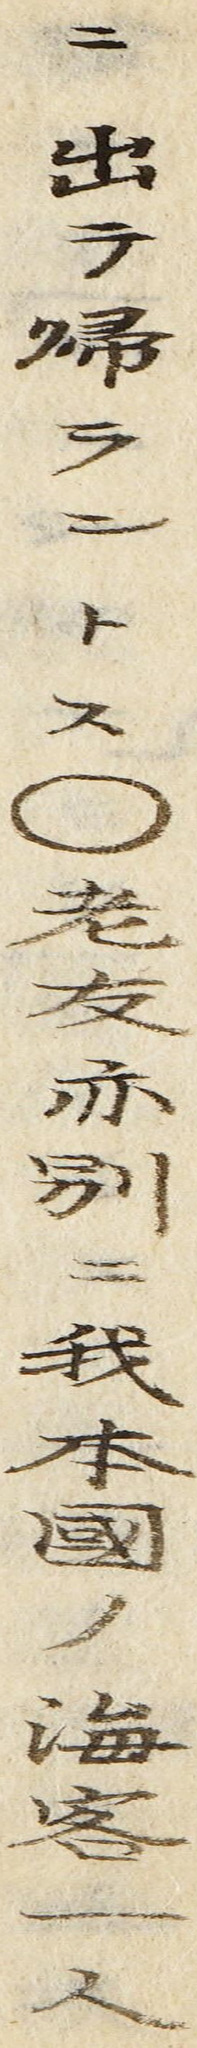ニ出テ帰ラントス◯老友亦別ニ我本国ノ海客一人
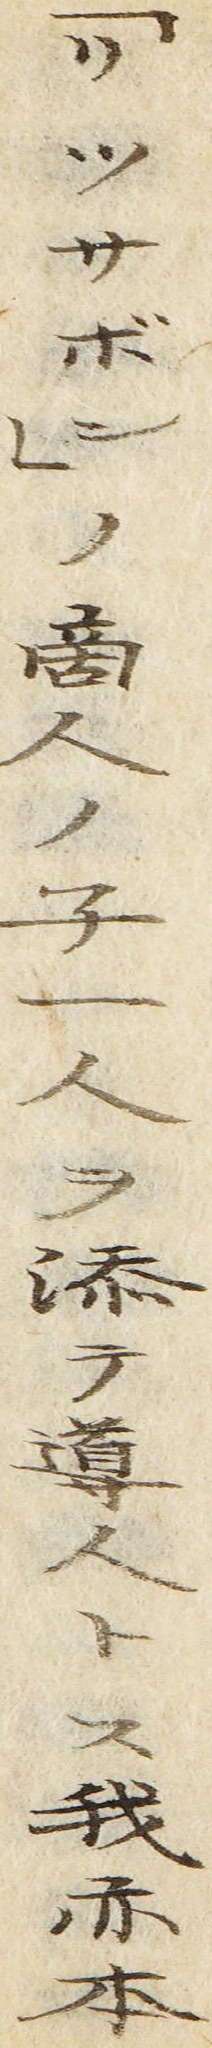「リツサボン」ノ商人ノ子一人ヲ添テ導人トス我亦本
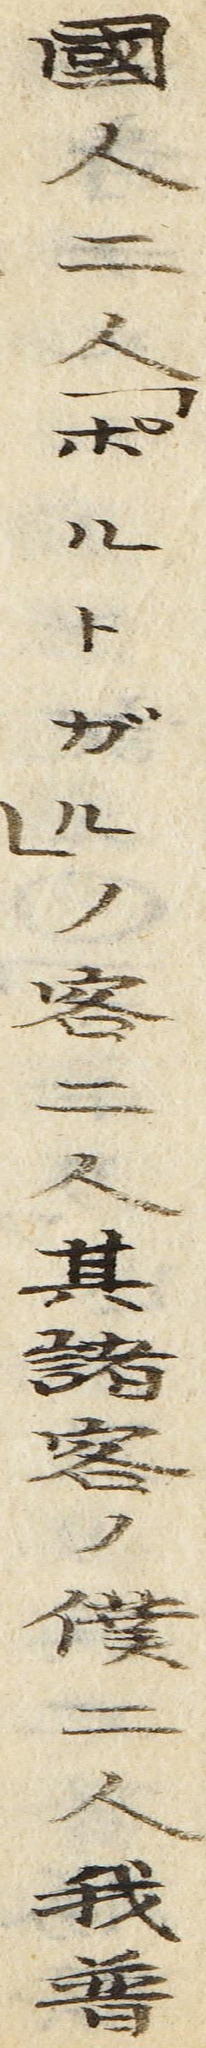国人二人「ポルトガル」ノ客二人其諸客ノ僕二人我普
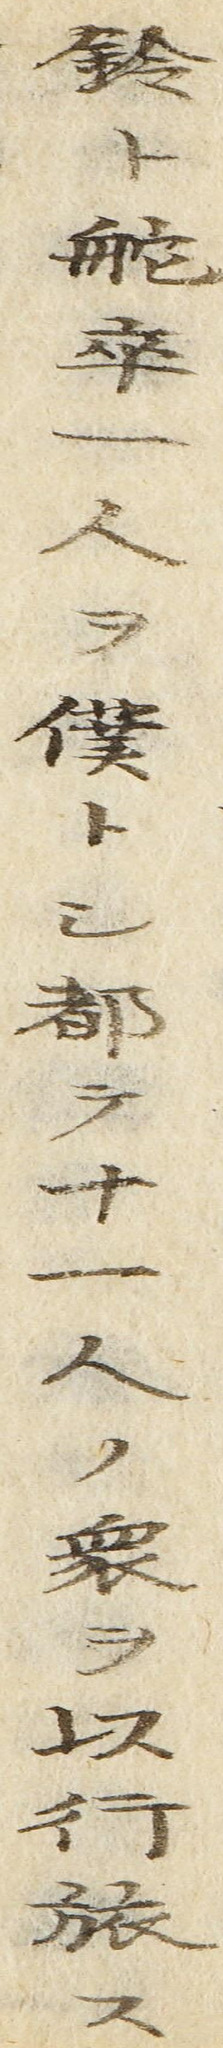鈴ト舵卒一人ヲ僕トシ都テ十一人ノ衆ヲ以行旅ス
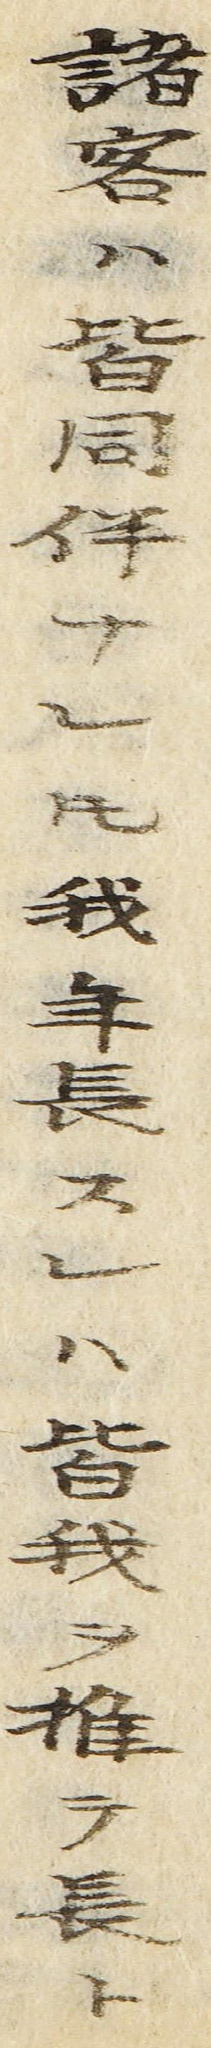諸客ハ皆同伴ナレトモ我年長スレハ皆我ヲ推テ長ト

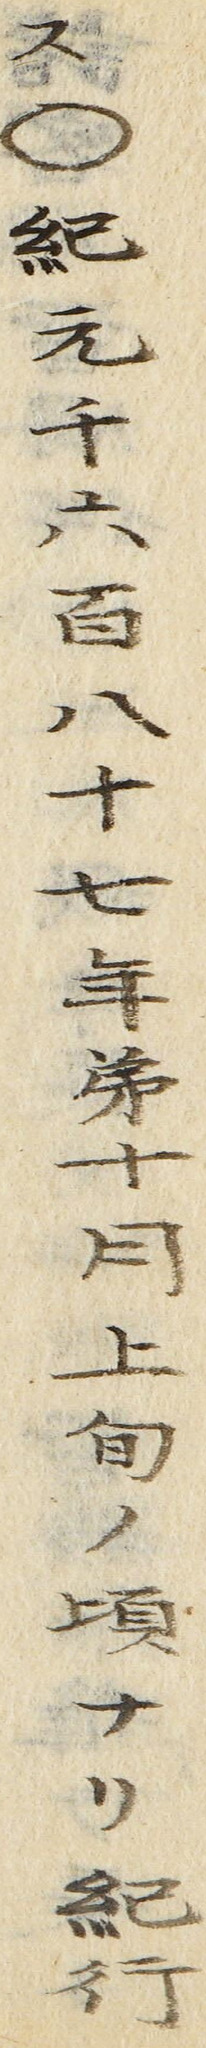ス◯紀元千六百八十七年第十月上旬ノ頃ナリ紀行
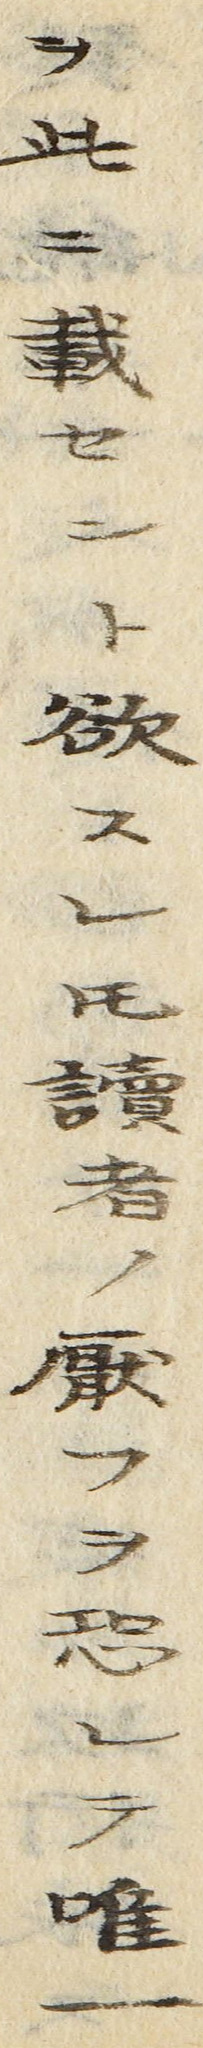ヲ此ニ載セント欲スレトモ読者ノ厭フヲ恐レテ唯一
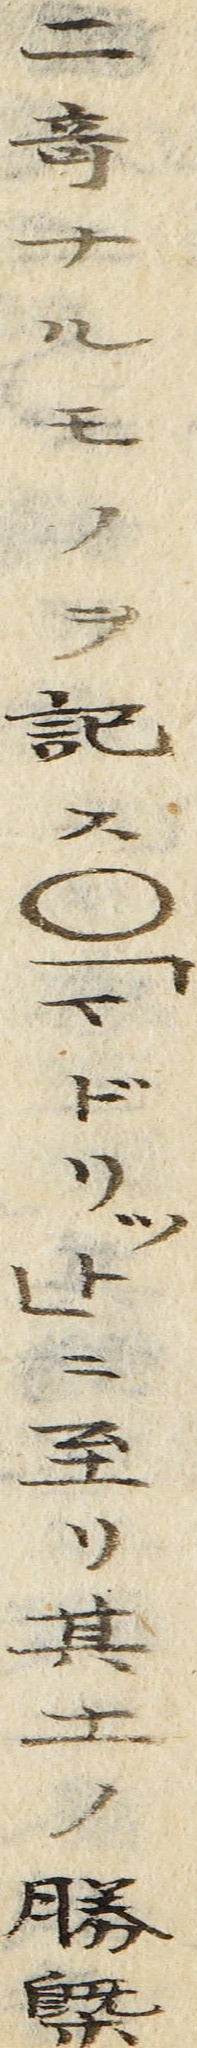二奇ナルモノヲ記ス◯「マドリット」ニ至リ其土ノ勝槩
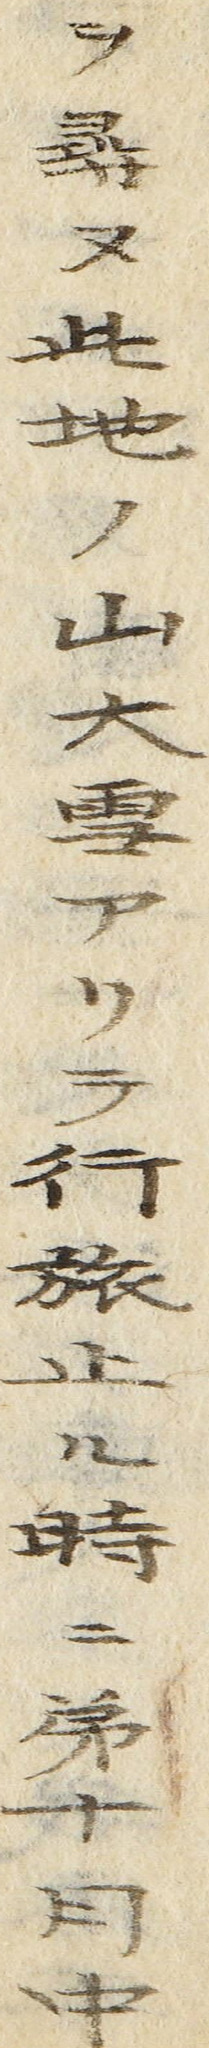ヲ尋ヌ此地ノ山大雪アリテ行旅止ル時ニ第十月中
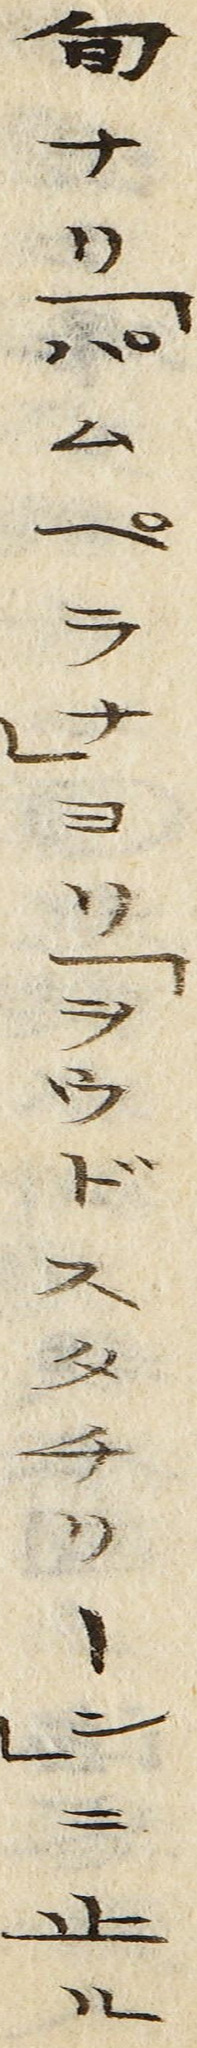旬ナリ「パムペラナ」ヨリ「ヲウドスタチリーン」ニ止ル
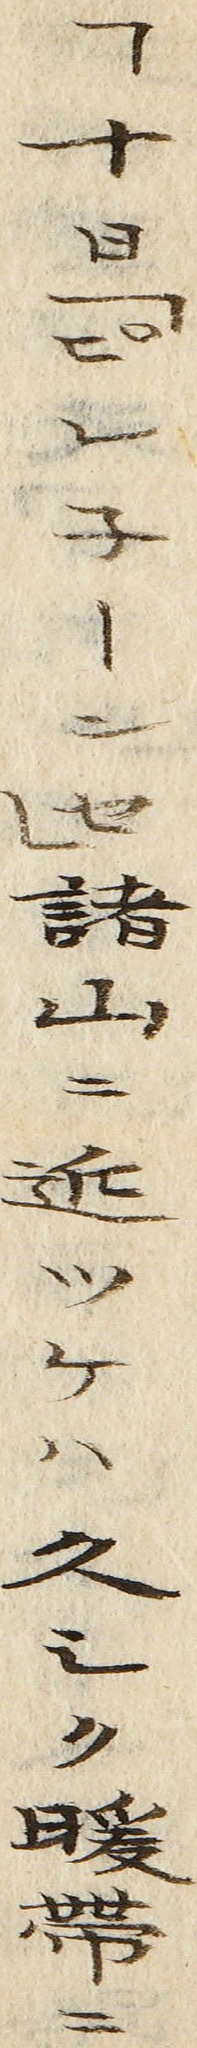コト十日「ピレネーンセ」諸山ニ近ツケハ久シク暖帯ニ
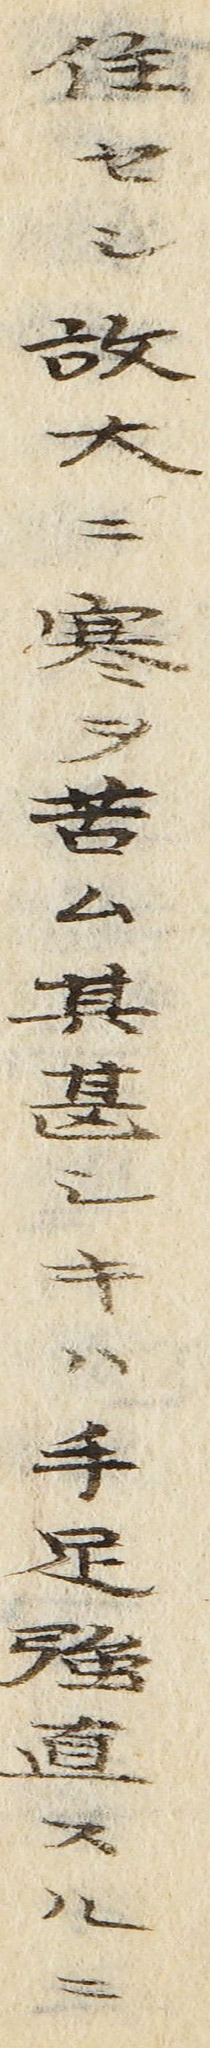住セシ故大ニ寒ヲ苦ム其甚シキハ手足強直スルニ
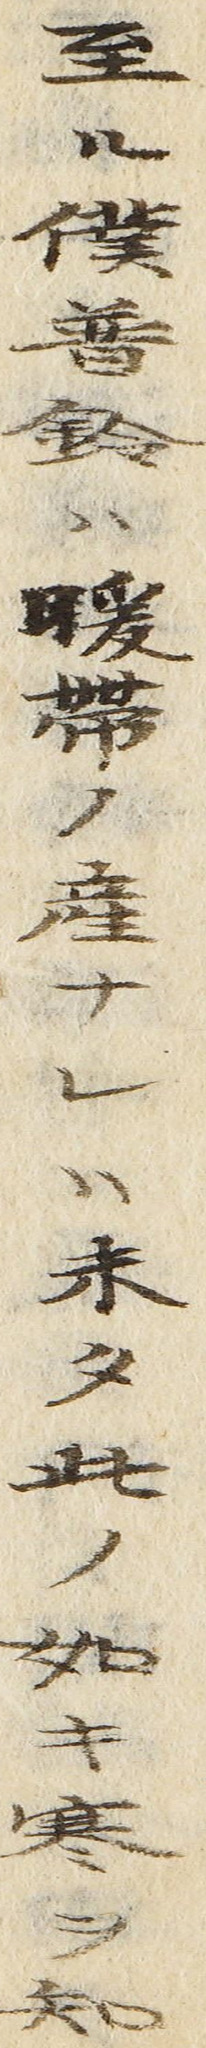至ル僕普鈴ハ暖帯ノ産ナレハ未タ此ノ如キ寒ヲ知
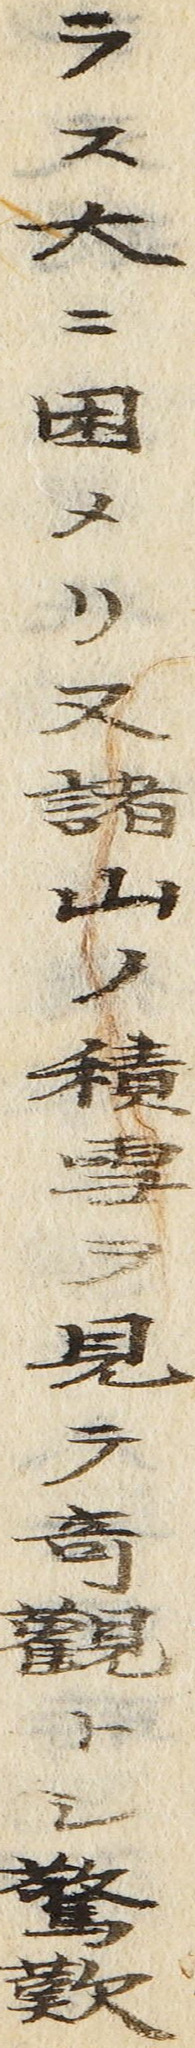ラス大ニ困メリ又諸山ノ積雪ヲ見テ奇観トシ驚歎
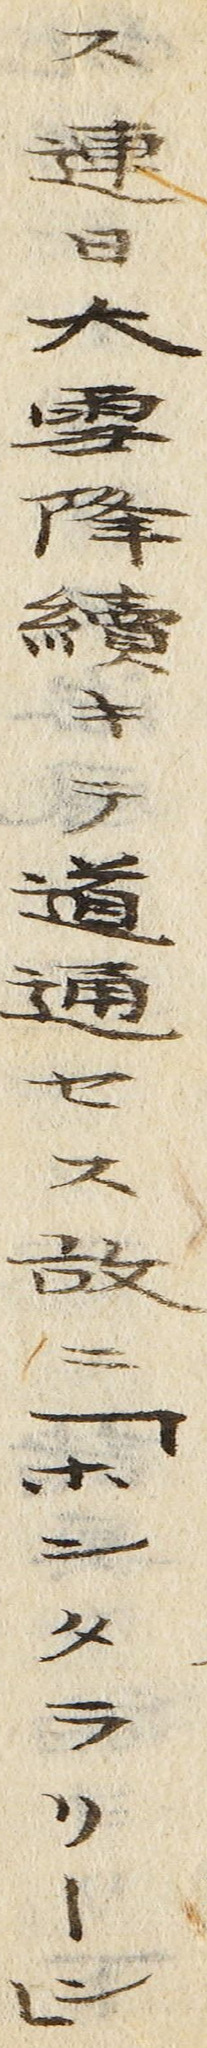ス連日大雪降続キテ道通セス故ニ「ホンタラリーン」
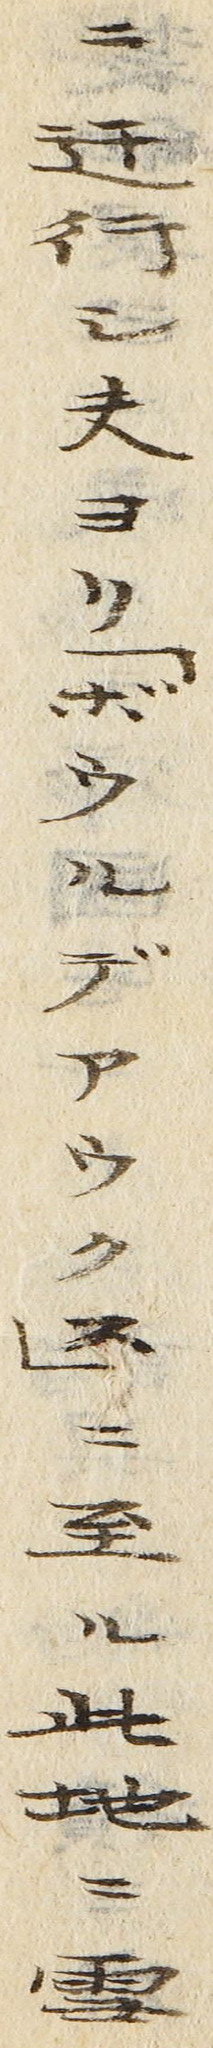ニ迂行シ夫ヨリ「ボウルデアウクス」ニ至ル此地ニ雪
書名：漂流紀事
